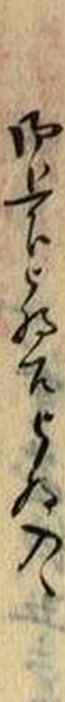御上下被為召被為入候
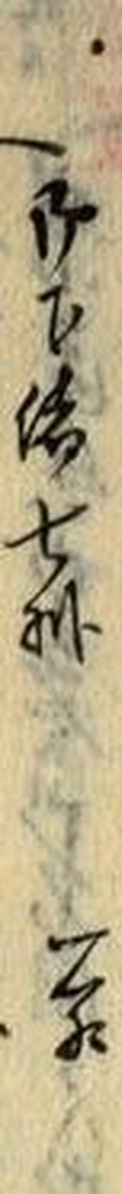御下緒七掛一箱
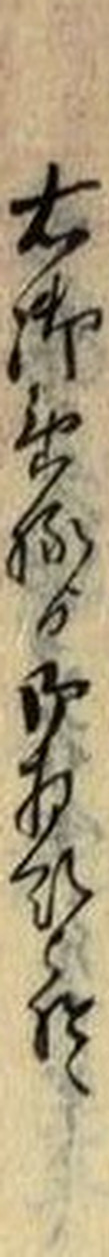右御台様ゟ御拝領被遊候
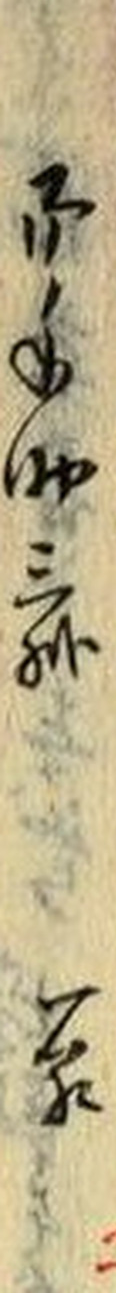御手助三掛一箱
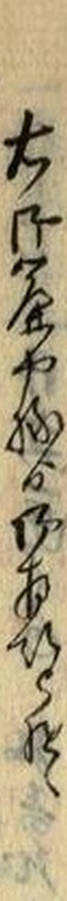右御簾中様ゟ御拝領被遊候
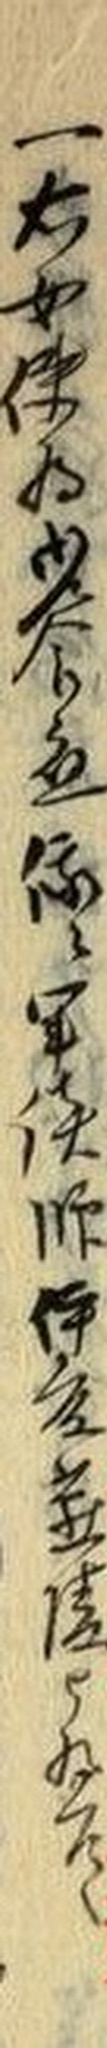一右女使為御饗応俄ニ軍談師伊藤燕陵被為召候
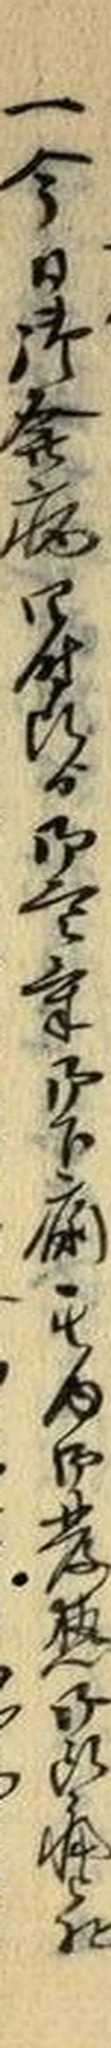一今日御発病四時頃ゟ御寒気御下痢其内御発熱御頭痛被遊
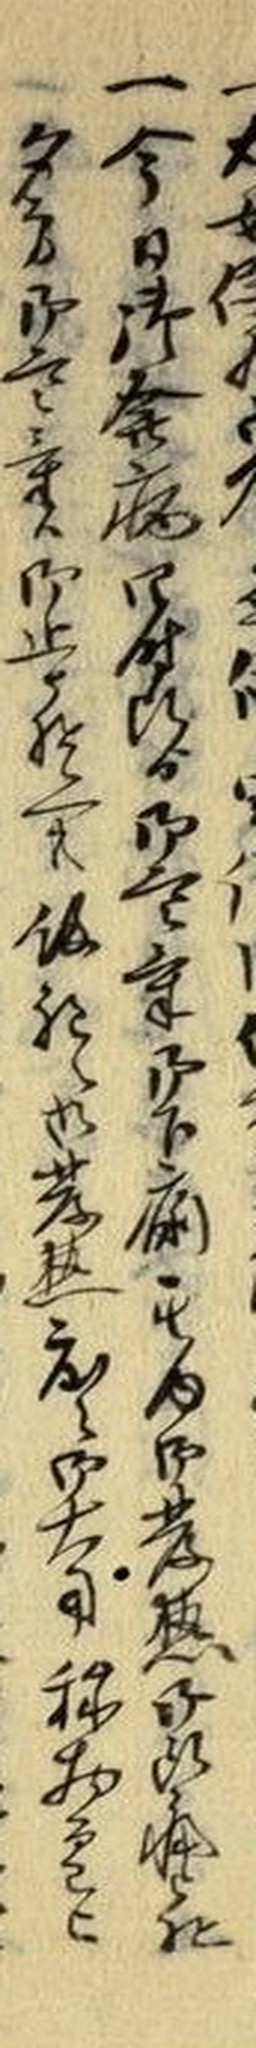夕方御寒気ハ御止被遊候へ共余程之御発熱度々御大用穢物已而被
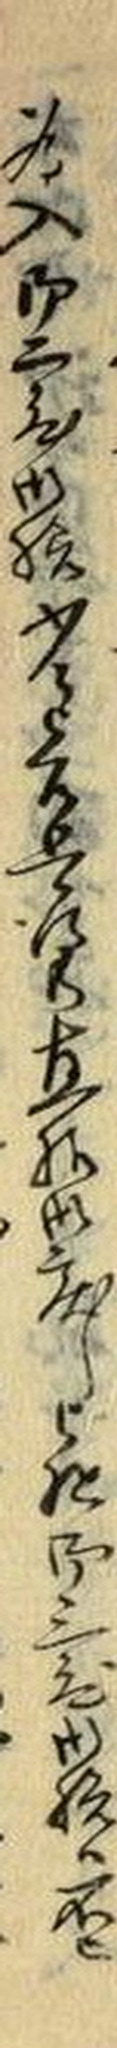為入御二度御膳少々被召上候得共直様御戻し被遊御三度御膳ハ不被
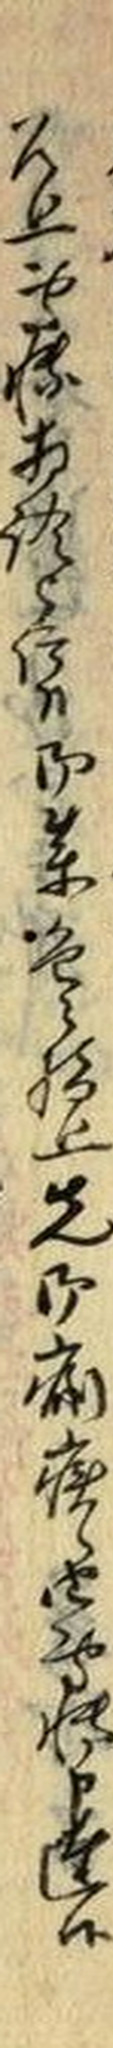召上専博拝診被仰付御薬色々指上先御痢疾之由専博申達候
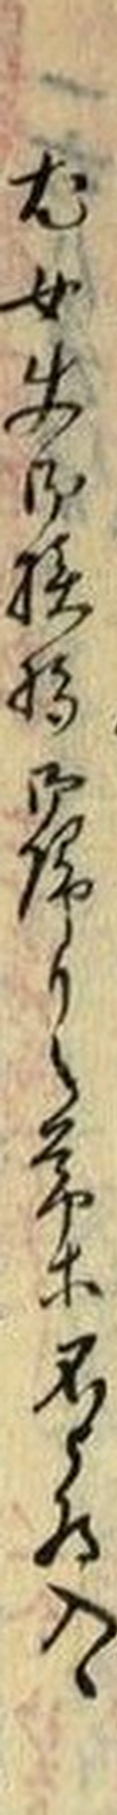尤女使御挨拶御帰り之節等不被為入候
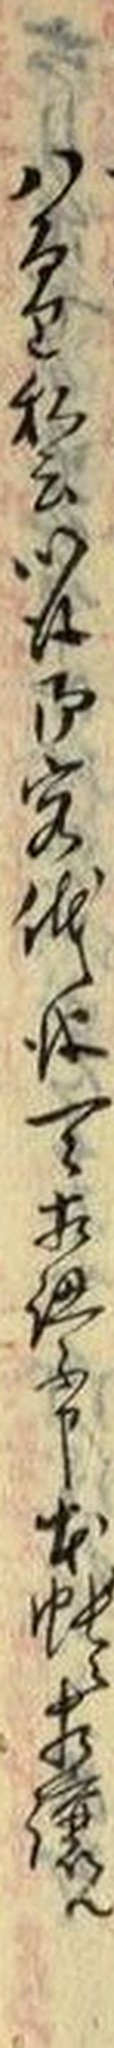八百里私云以後御容体之儀一々相認不申本帳ニ相譲ㇽ
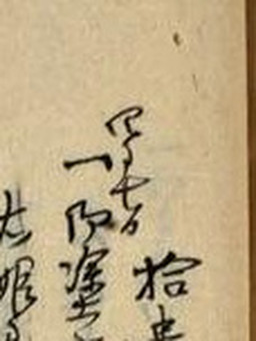四月七日
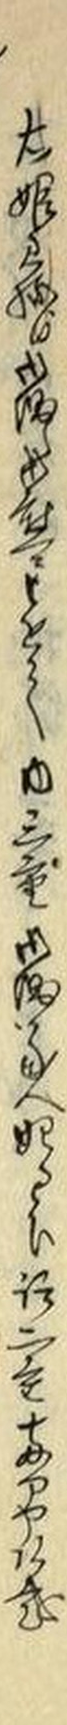右姫君様ゟ御側之御慰ニ被進之内三重御側御用人始被下跡二重両部や頂戴
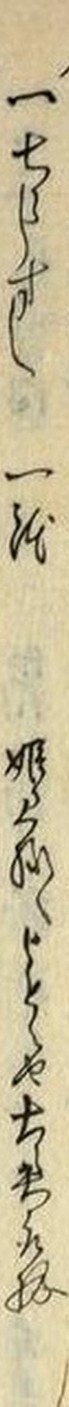一ちらしすし一鉢姫君様へ被進之由大奥取扱
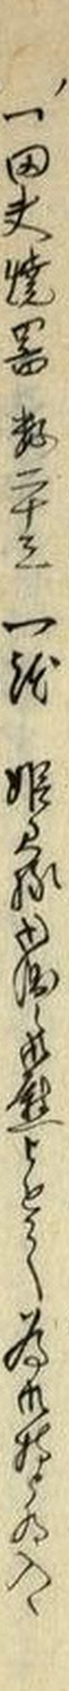一田夫焼器数二十三一鉢姫君様御側之御慰被進之為御持被為入候
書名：少傅日録抄（斉承付側向頭取日記、在府）
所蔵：福井県文書館 Fukui Prefectural Archives
